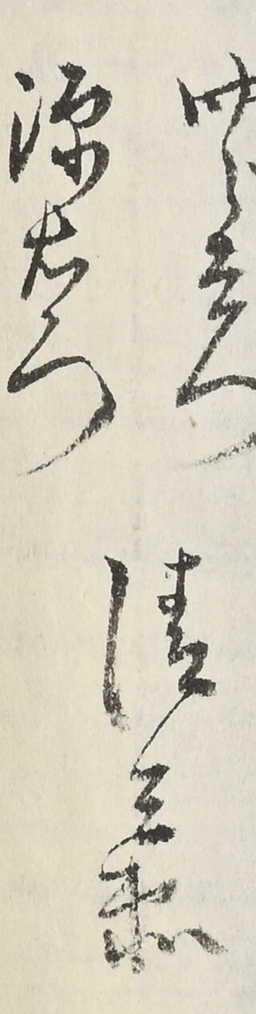四郎右衛門清兵衛
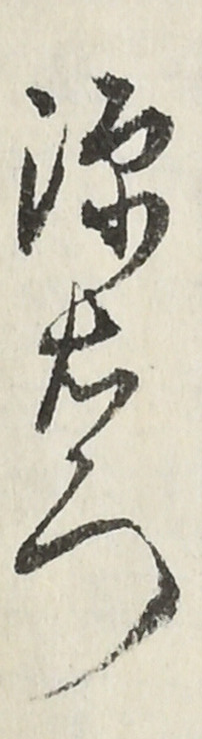源右衛門

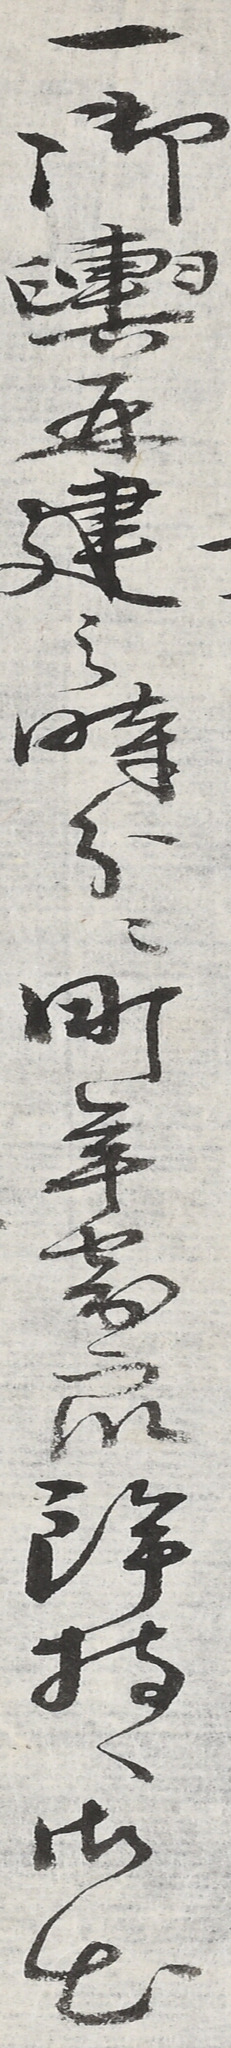一御輿再建之時分ニ町年寄衆鉾持へ御出
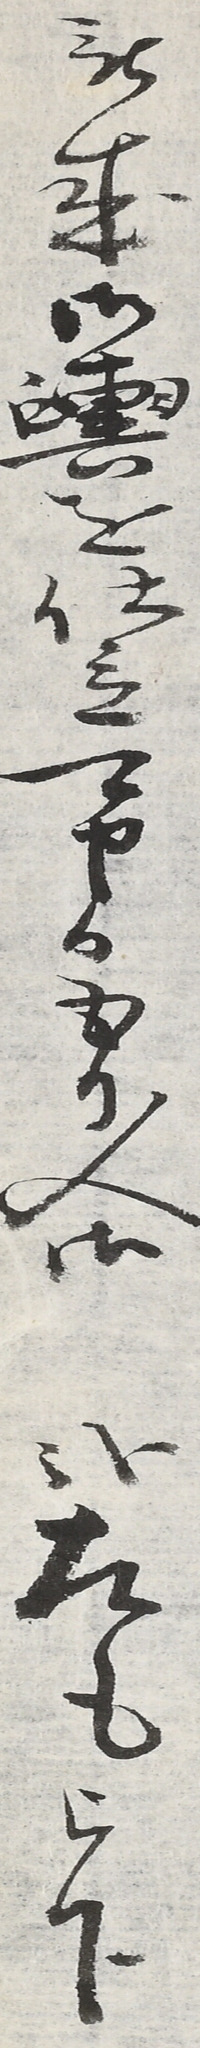被成御輿を仕立可申候もり人御弐左も被下
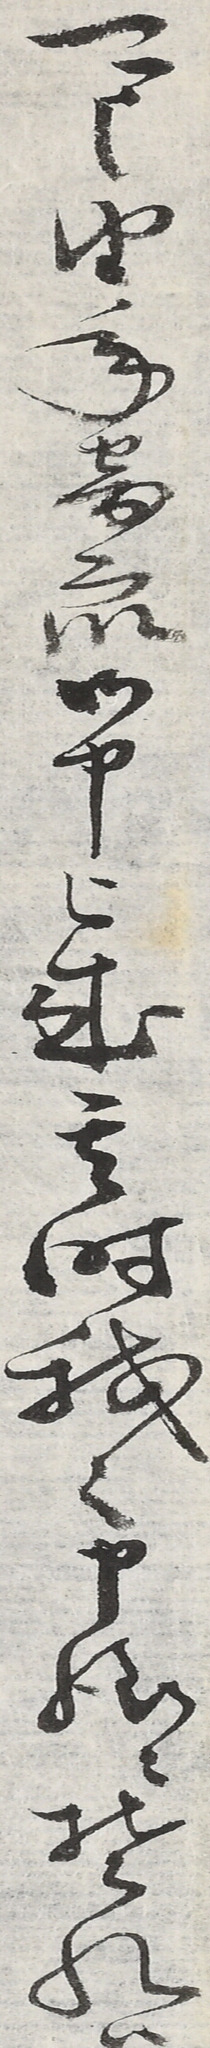可申由年寄衆御申被成其時我々申様ニそれハ
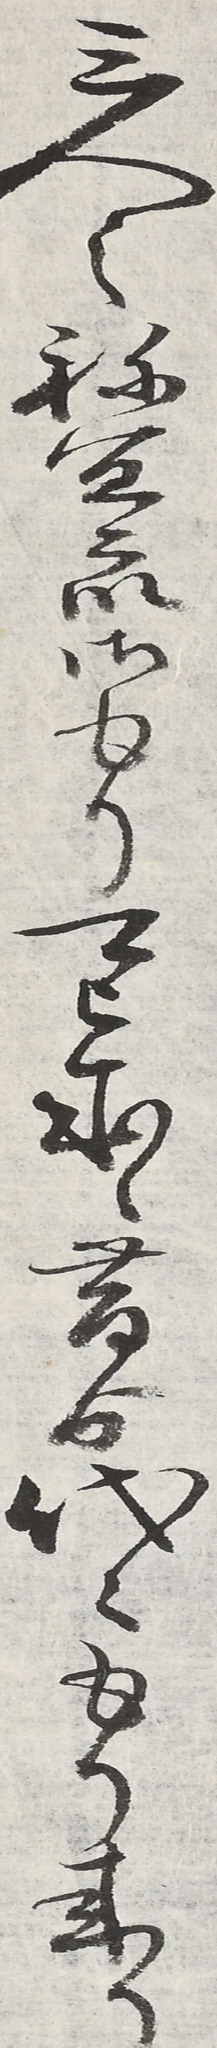三人之祢宜衆御もり可被成候昔ゟ代々もり来り
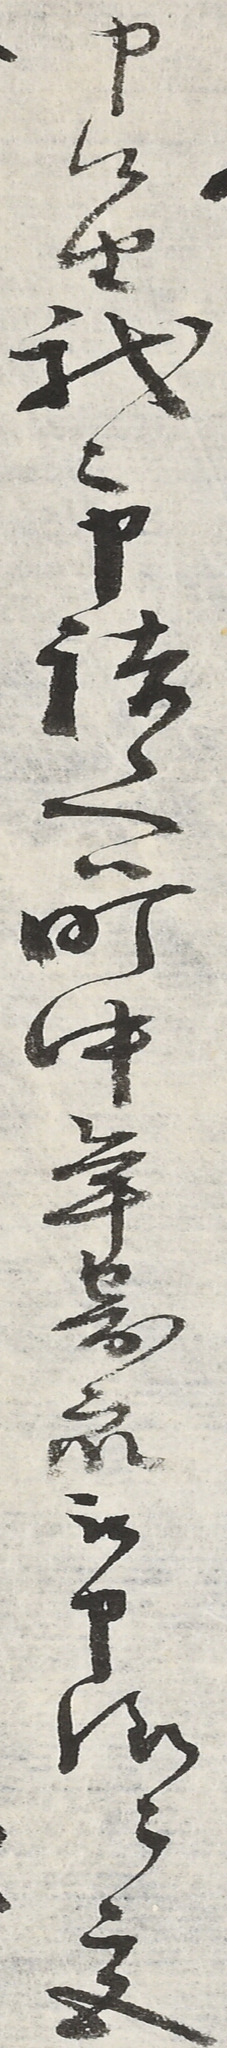申候由我々申詰候ヘハ町中年寄衆被申様ニ宮
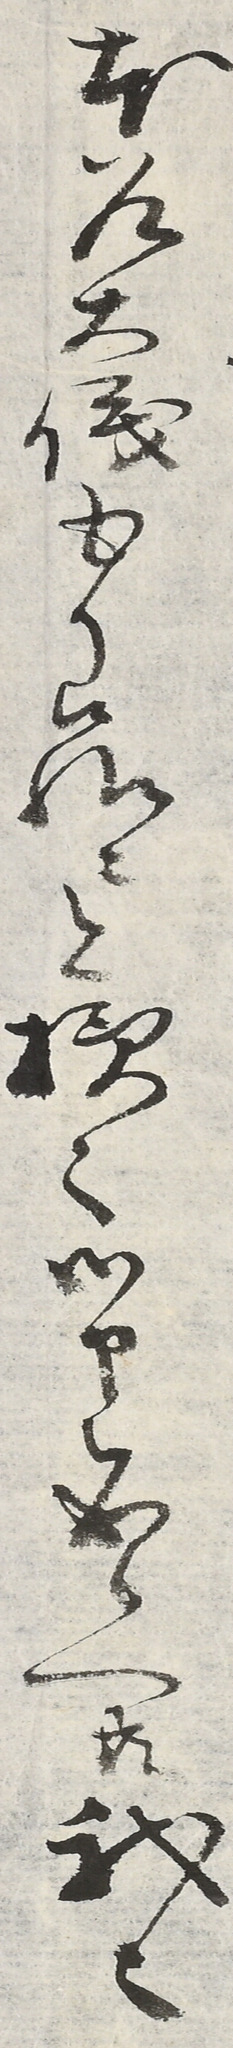本乍大儀もり候様ニと様々御申被成候へ共我々
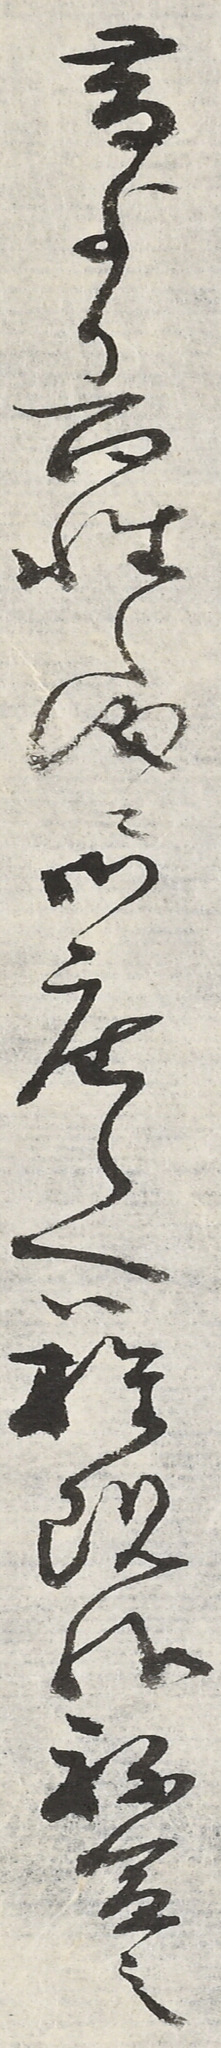昔より百姓之儀ニ御座候へハ権現様祢宜之
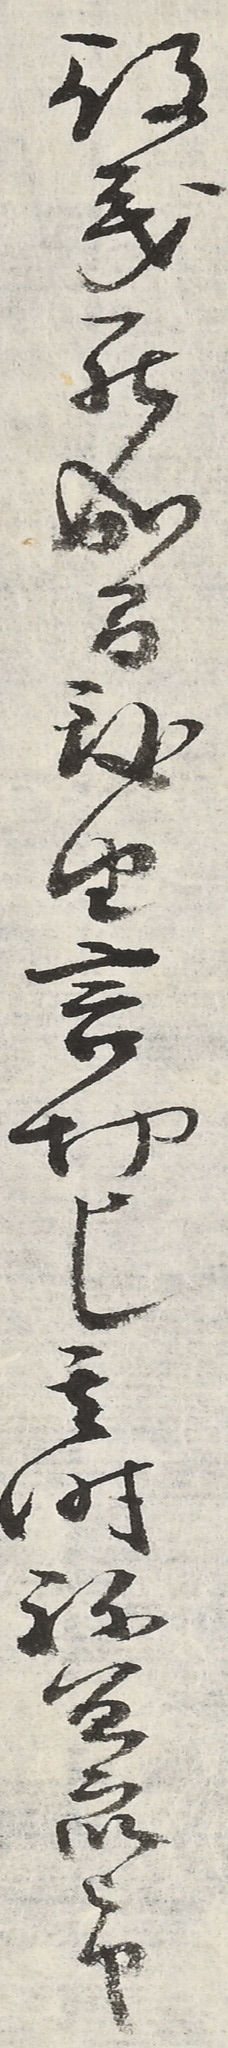役義罷成間敷由言切申候其時祢宜衆被申
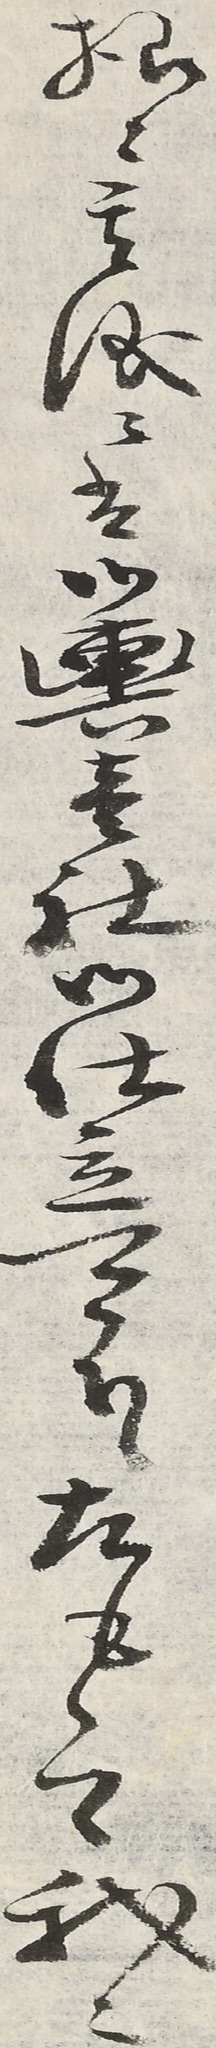様ニ其儀ニは御輿壱社御仕立可被下候左も候ハヽ我々
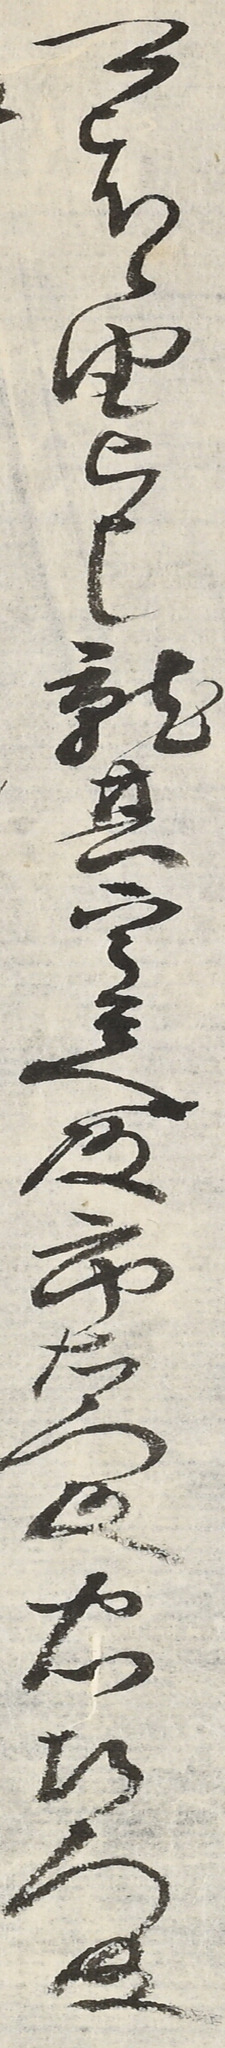可被下候由被申候就其宇兵衛殿市右衛門殿忠左衛門殿
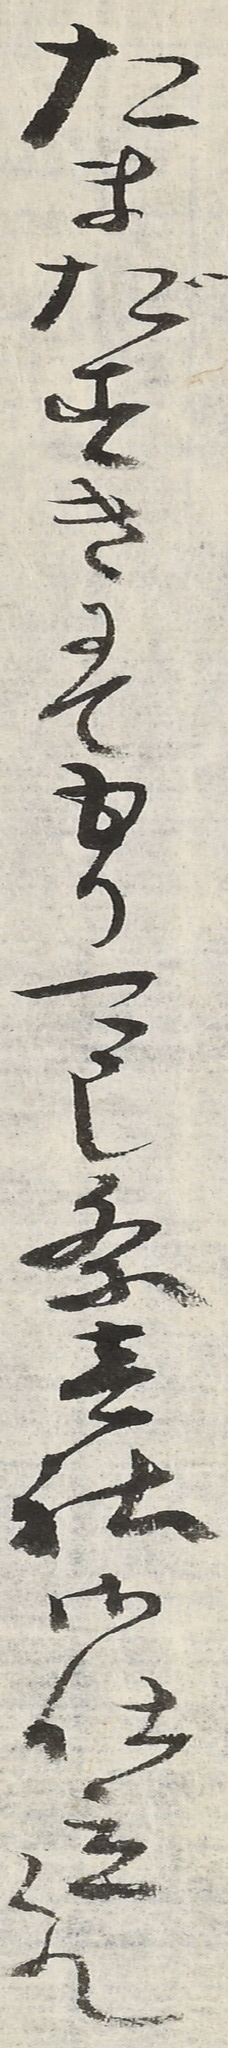たまだすきにてもり可申候条壱社御仕立くれ
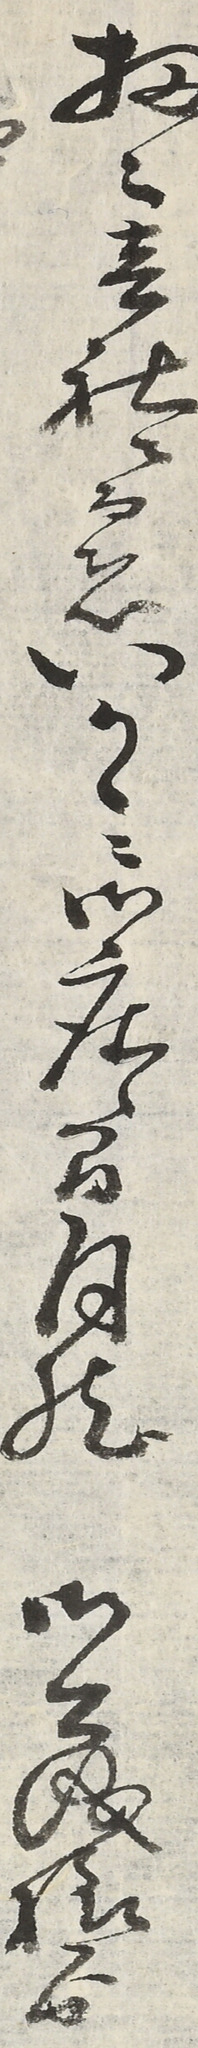扨々壱社ニ而者いかゝニ御座候間自然御公儀様ゟ
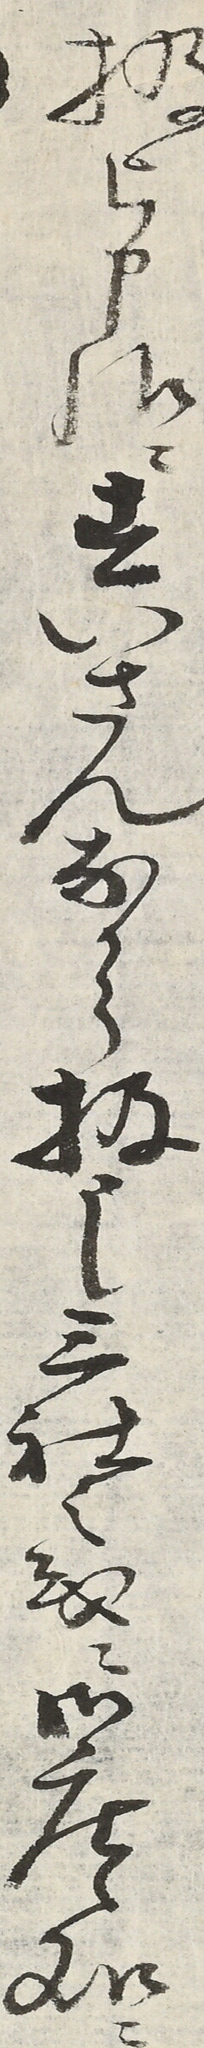扱被申様ニすいさんなから扱申候三社之義ニ御座候処ニ
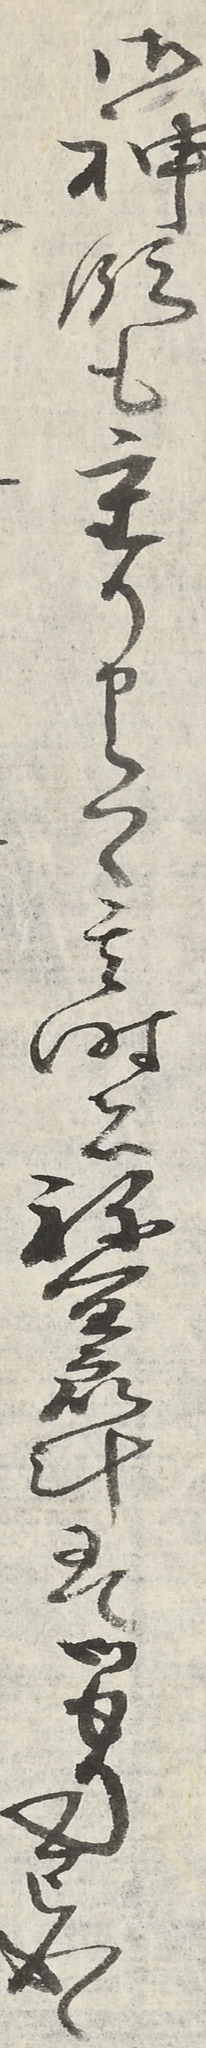御神領も重り申候ハヽ其時者祢宜衆計にて御もり可被成候
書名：旧記
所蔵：伊那市立高遠町図書館・合同会社AMANE
